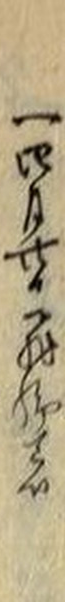四月廿日飛脚着
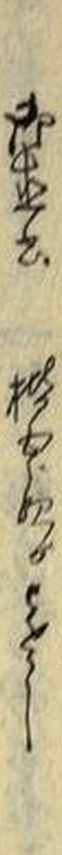御直書揩五郎様ゟ被進之
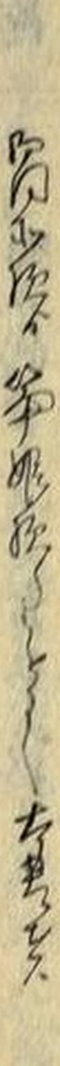同御同所様ゟ箏姫様へ被進之大奥へ出ス
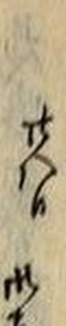廿八日
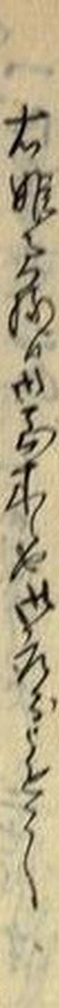右姫君様ゟ御到来之由御取分被進之
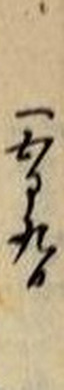一五月九日
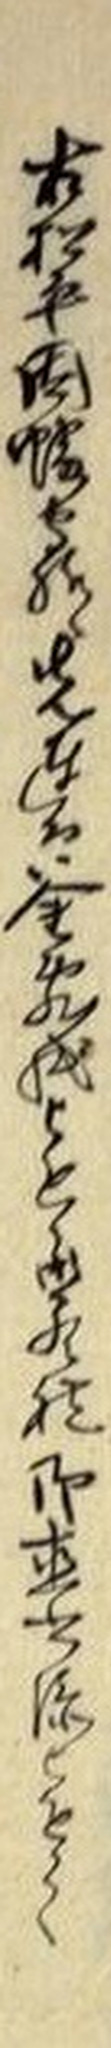右松平因幡守様へ先達而釜敷紙被進候御答礼御直書添被進之
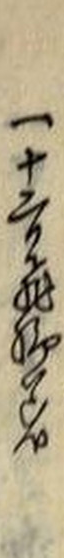一十二日飛脚着
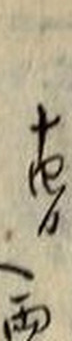十四日
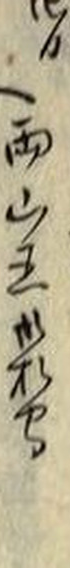両山王御札守
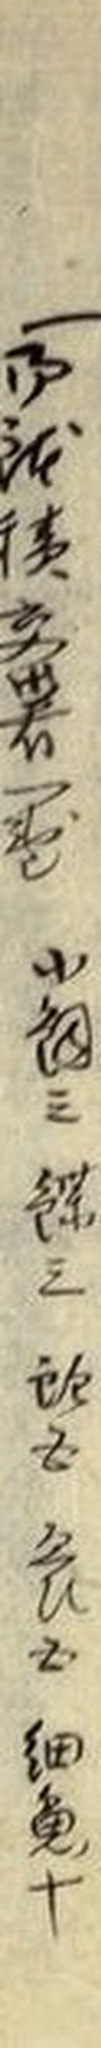御鉢積交御肴一台小鯛三鰈三鮑五ゑひ五細魚十
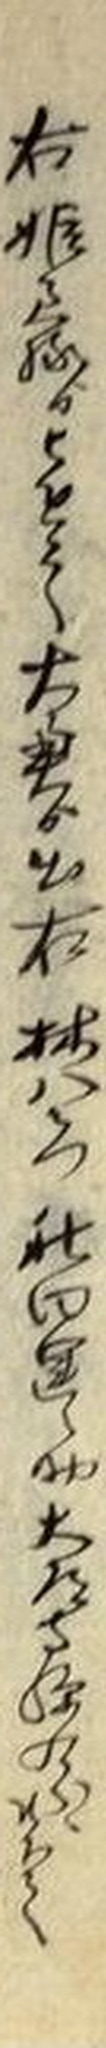右姫君様ゟ被進之大奥ゟ出右林八右衛門秋田運之助大道寺孫九郎へ被下之
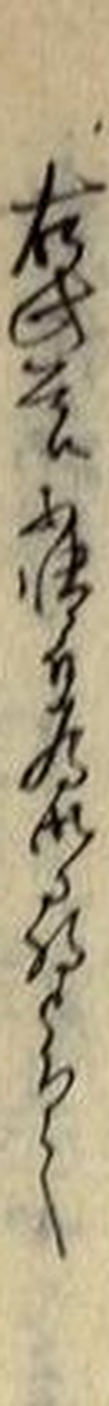右此節不快ニ付為御尋被下之
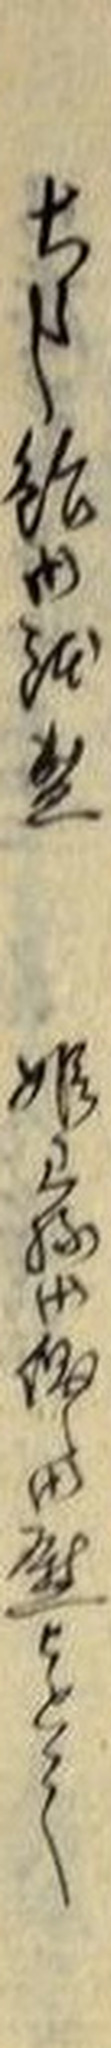ちらし鮨御鉢盛姫君様御側之御慰被進之

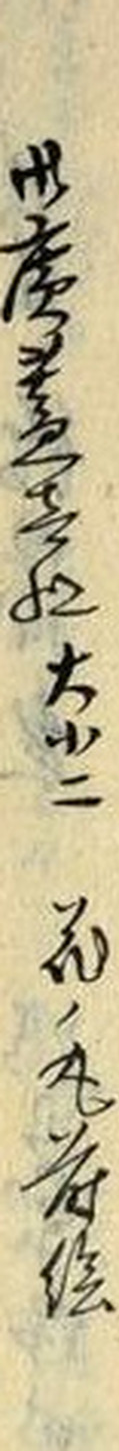御広蓋壱組大小二花ノ丸蒔絵
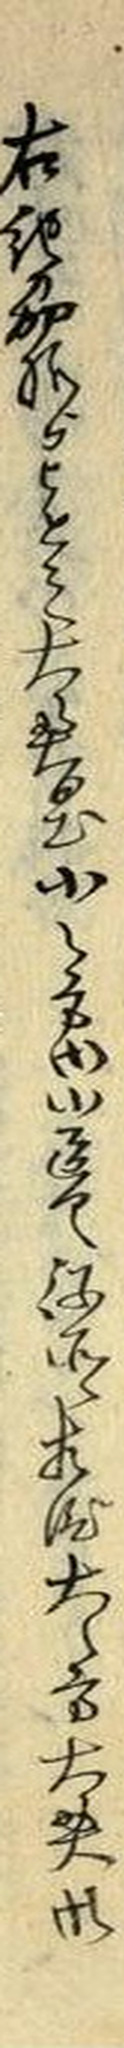右紀州様ゟ被進之大奥ゟ出小之方御小道具役所へ相渡大之方大奥御
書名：少傅日録抄（斉承付側向頭取日記、在府）
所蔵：福井県文書館 Fukui Prefectural Archives
